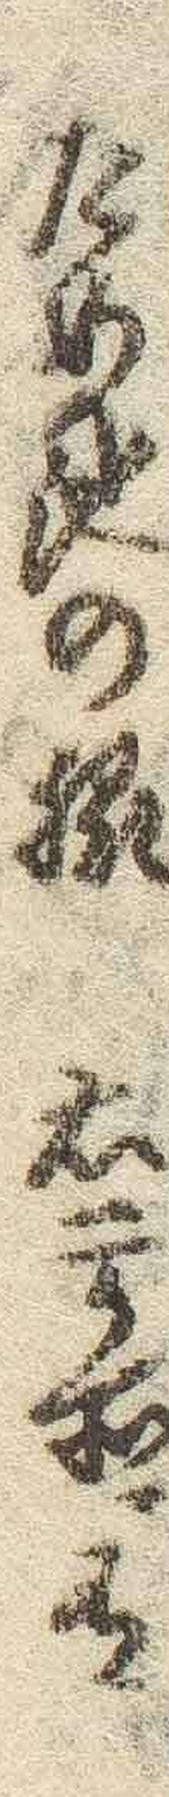ため池の脇右二ヶ所に有
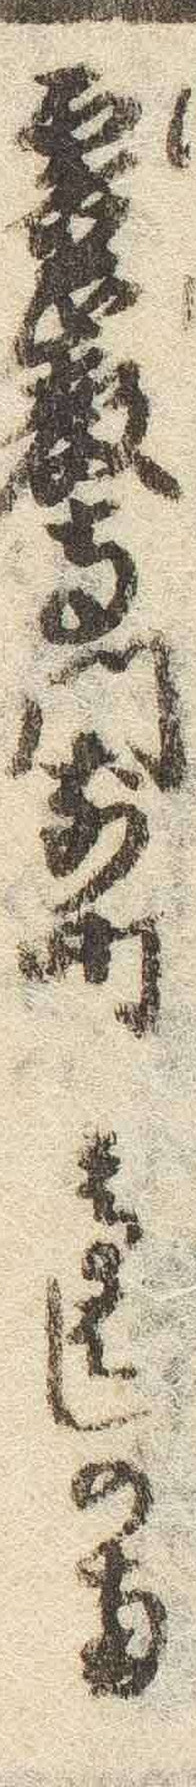霊厳寺門前町高はしの南
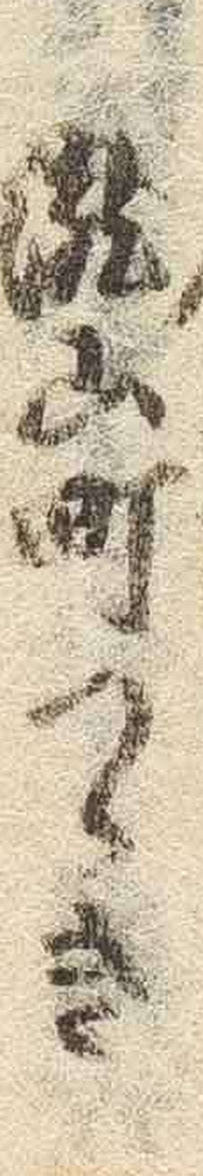瀧山町つゝき
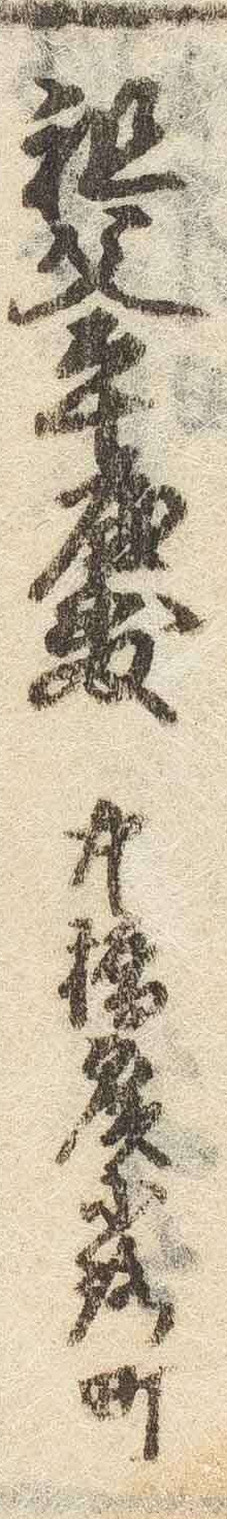祖父平屋敷中橋広小路町
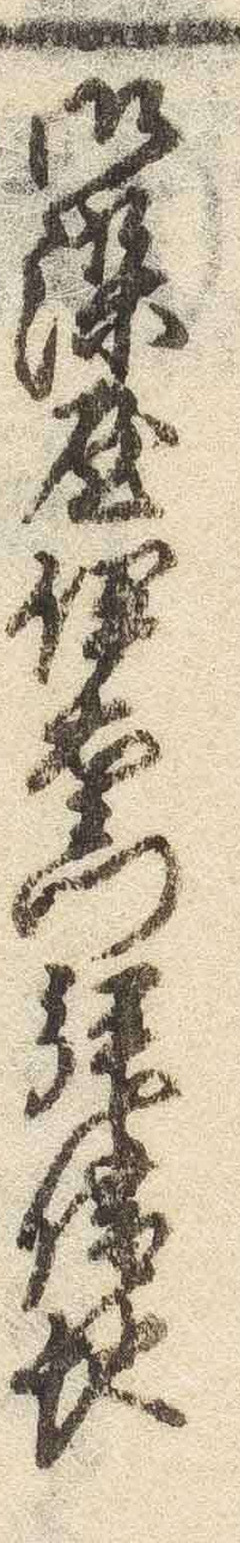御染屋伊右衛門拝借地
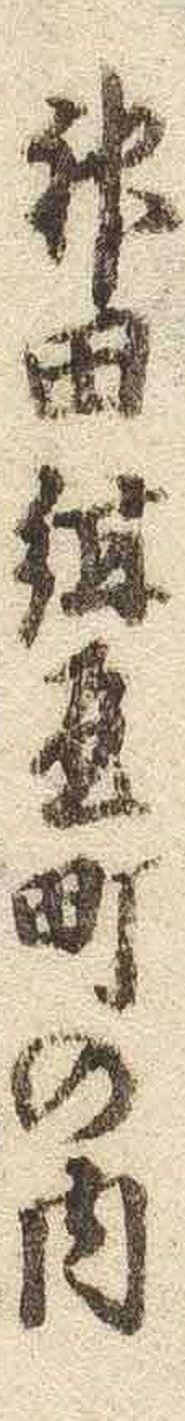神田紺屋町の内
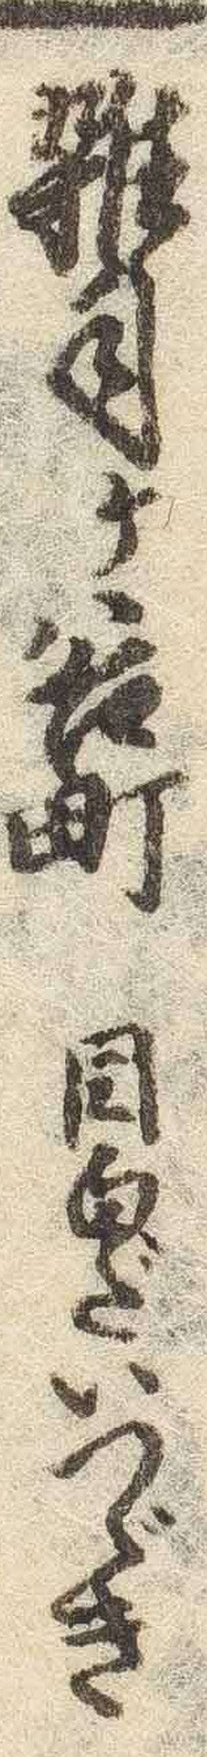雑司ヶ谷町目白だいつゞき
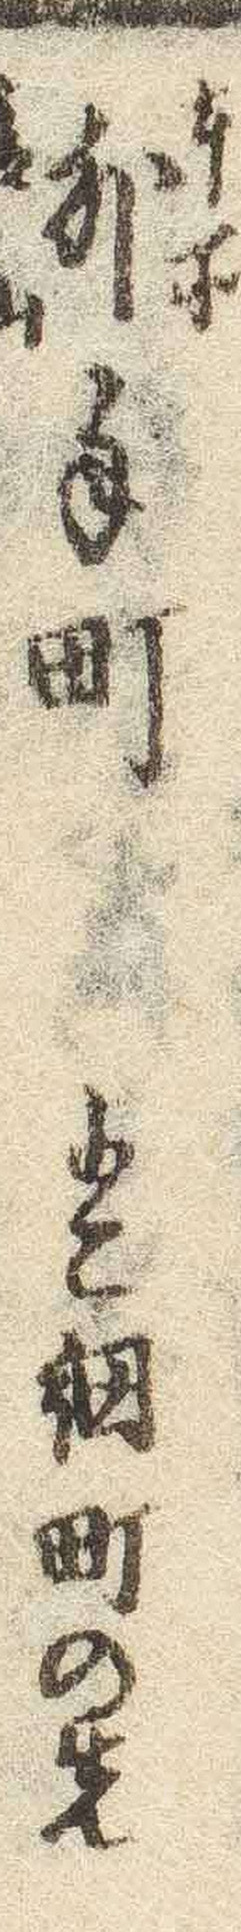外手町よこ網町の先
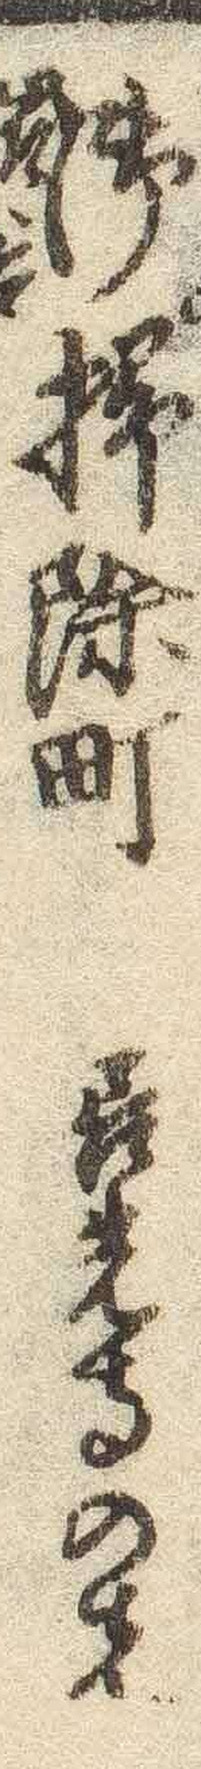御掃除町善光寺の先
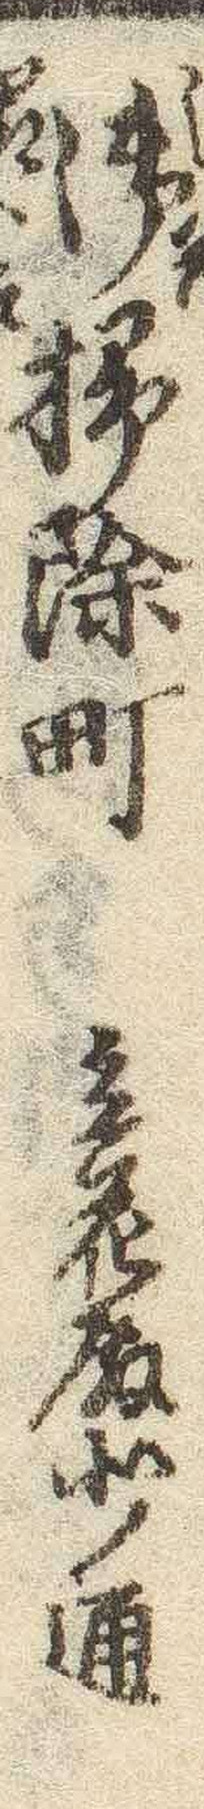御掃除町立花殿北ノ通
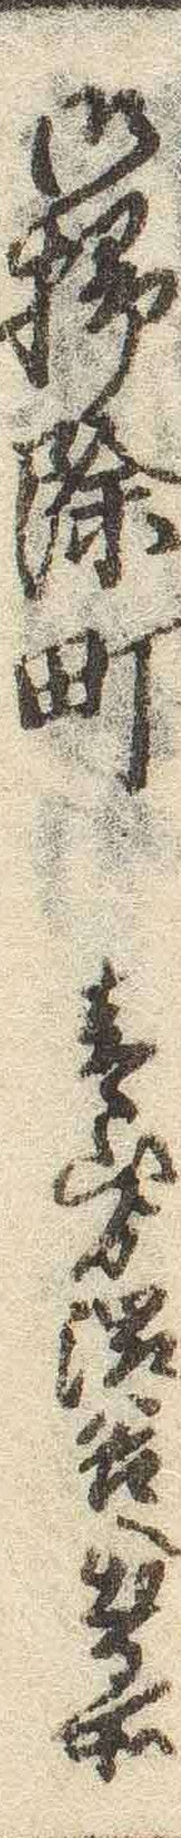御掃除町青山ゟ渋谷へ出る所
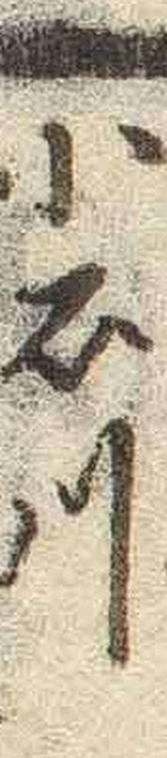小石川
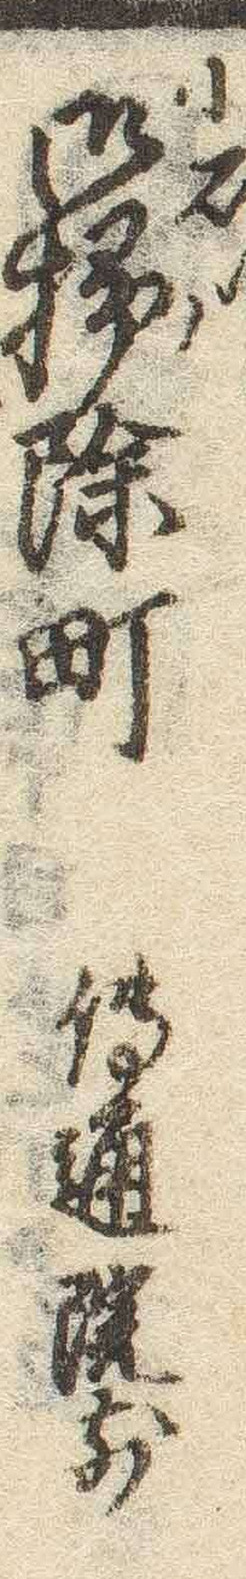御掃除町伝通院前
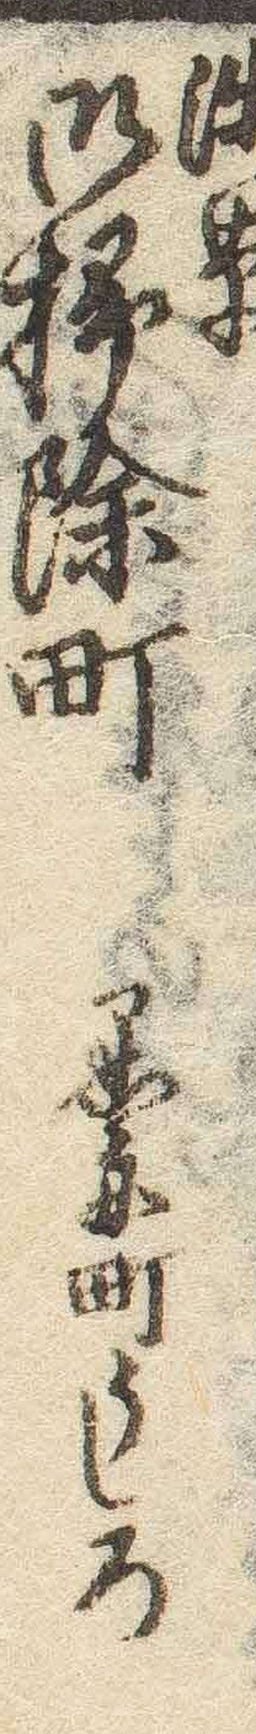御掃除町黒舟町うしろ
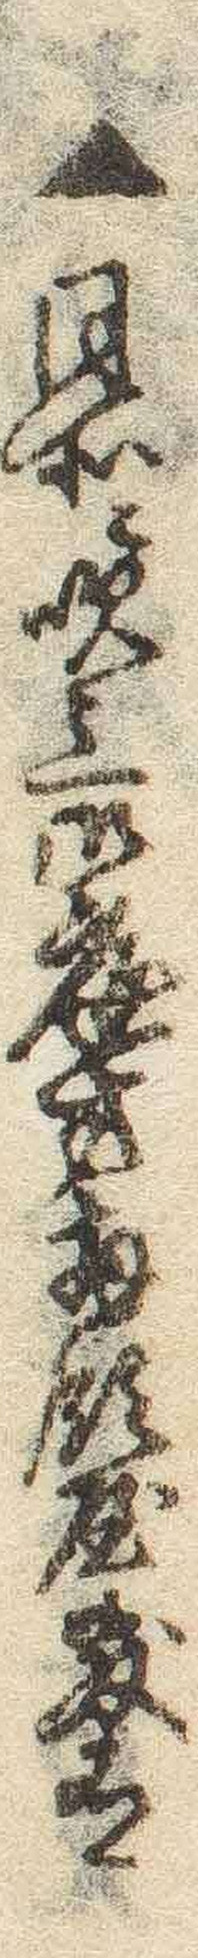▲同所に吹上御庭方拝領屋敷有
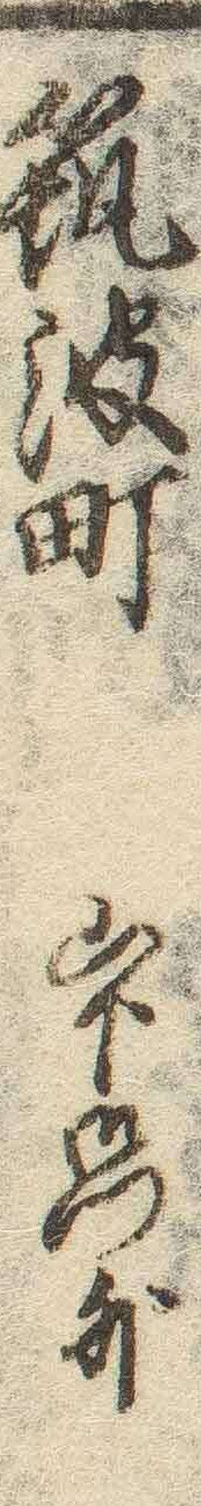筑波町山下御門外
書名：江戸町独案内
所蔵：東京学芸大学附属図書館 国文学研究資料館
